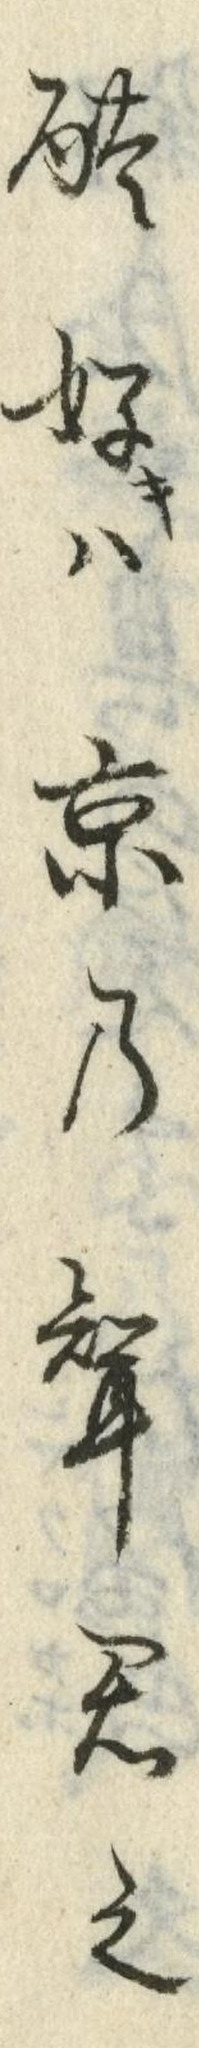醸好きは京の聟君之
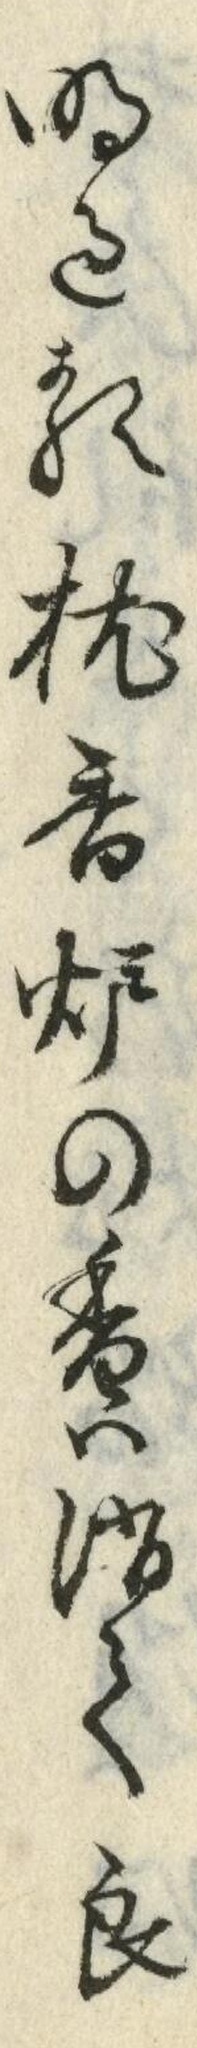明過る枕香炉の香は消て良
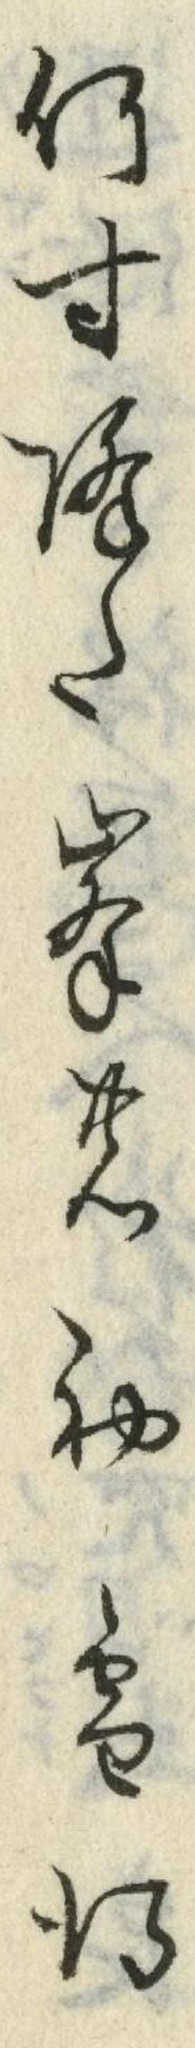何寸降た峰の初雪得
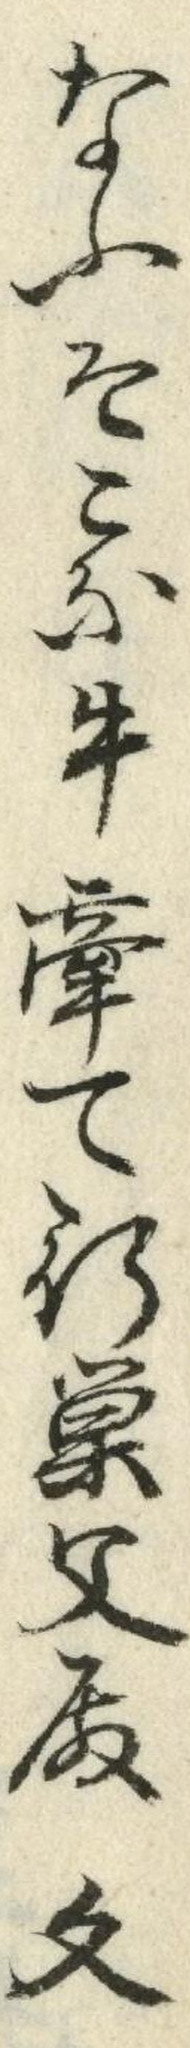なふそこに牛牽て行巣父殿文
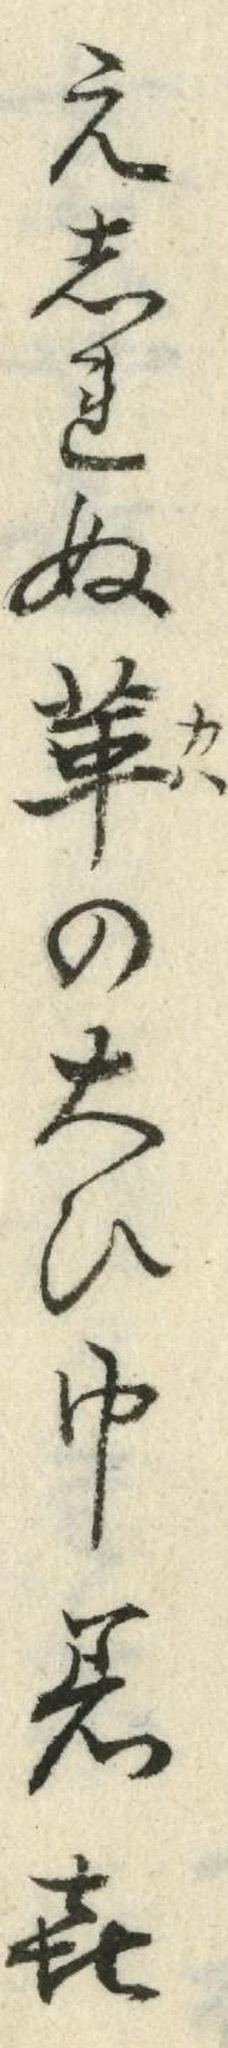元しれぬ革の大ひ巾着喜
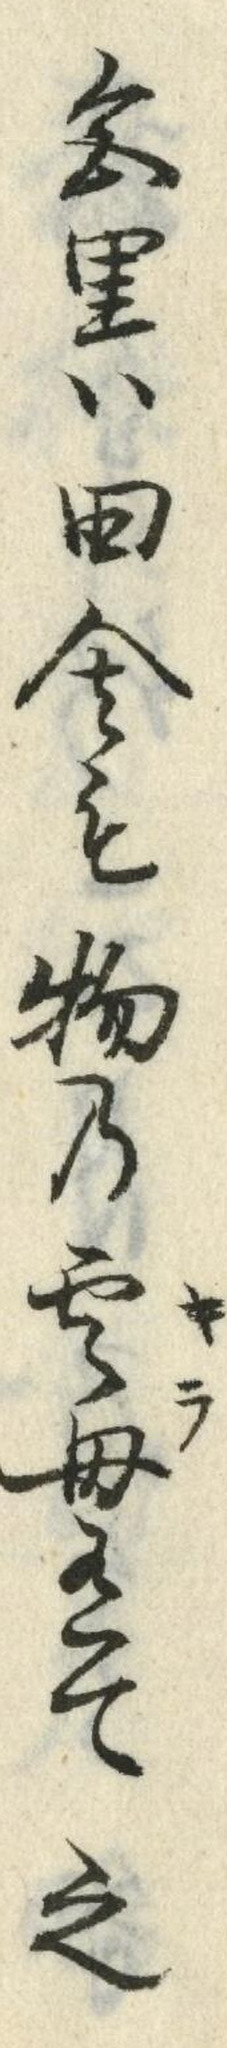宮里は田舎も物の雲母有て之
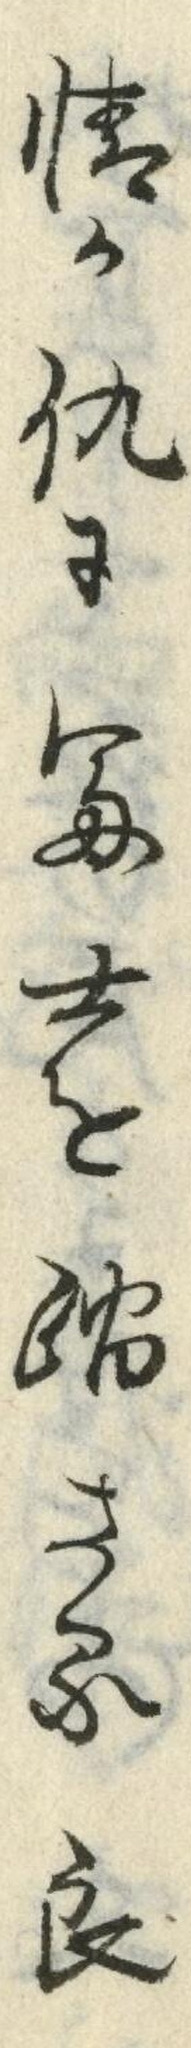情か仇に富士を踏さる良
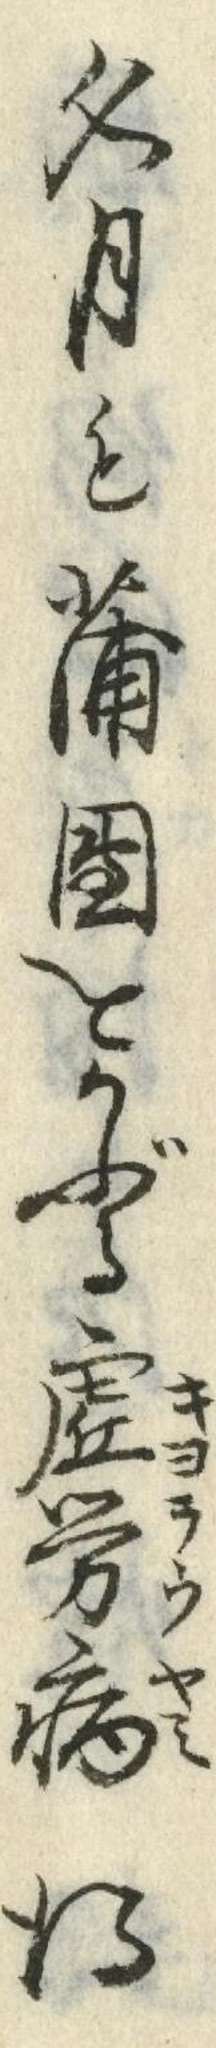名月も蒲団をかぶる虚労病得
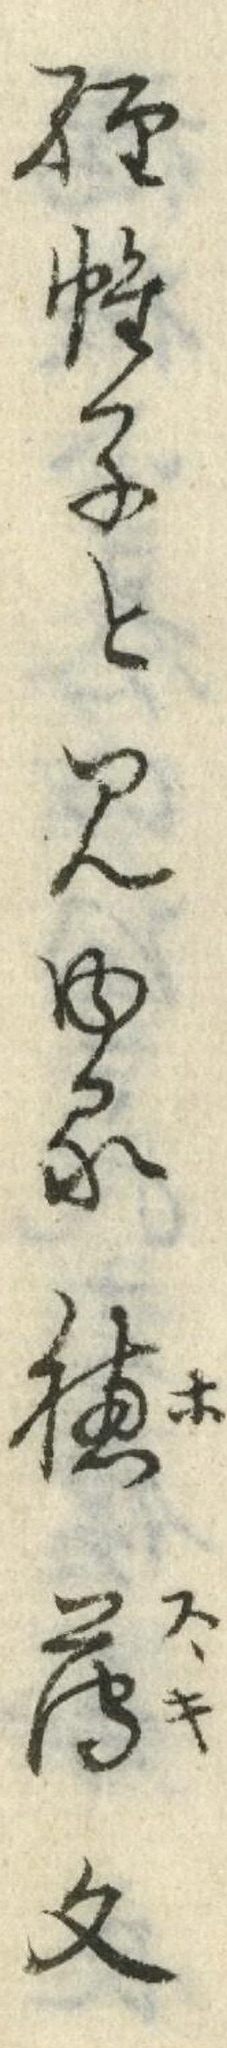軽帷子と見ゆる穂薄文
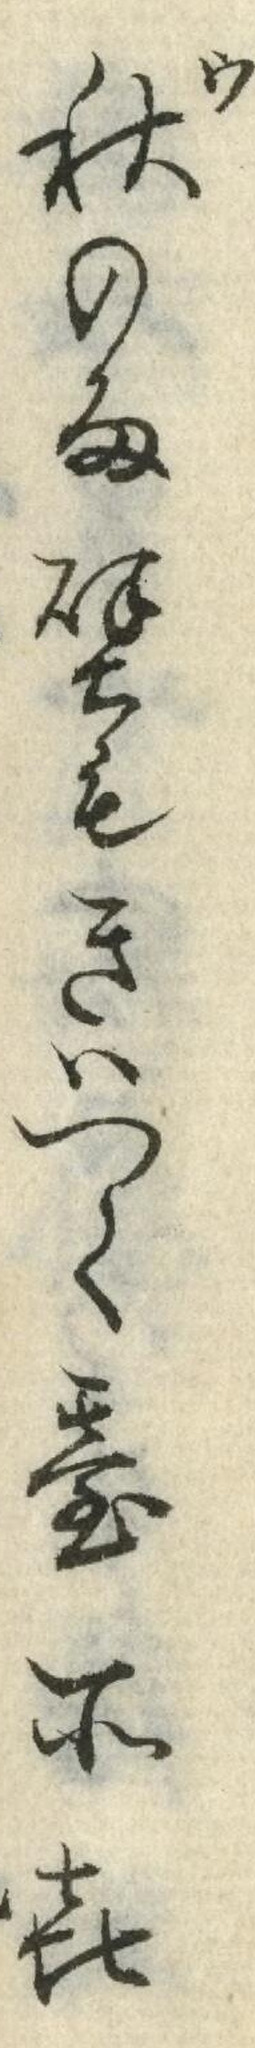秋の雨壁もきはつく台所喜

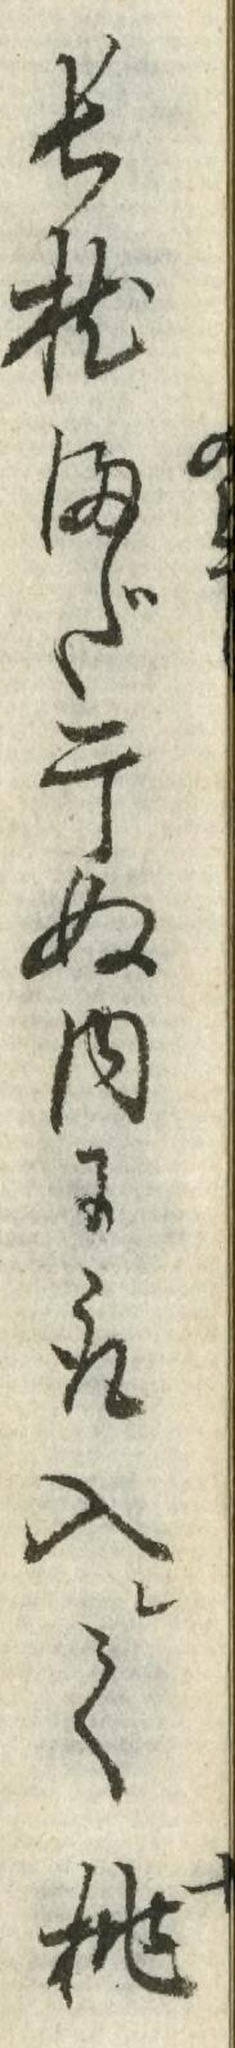長枕まだ干ぬ内に取入れて桃
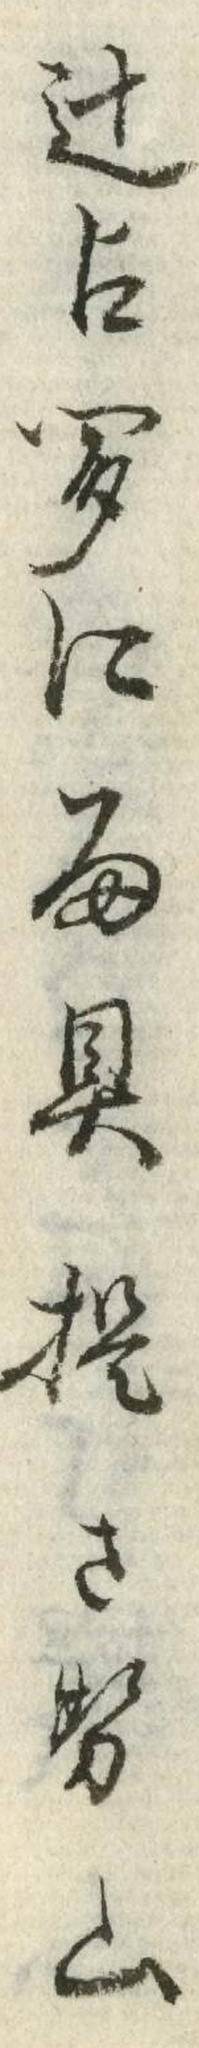辻占聞きに雨具提さぬ山
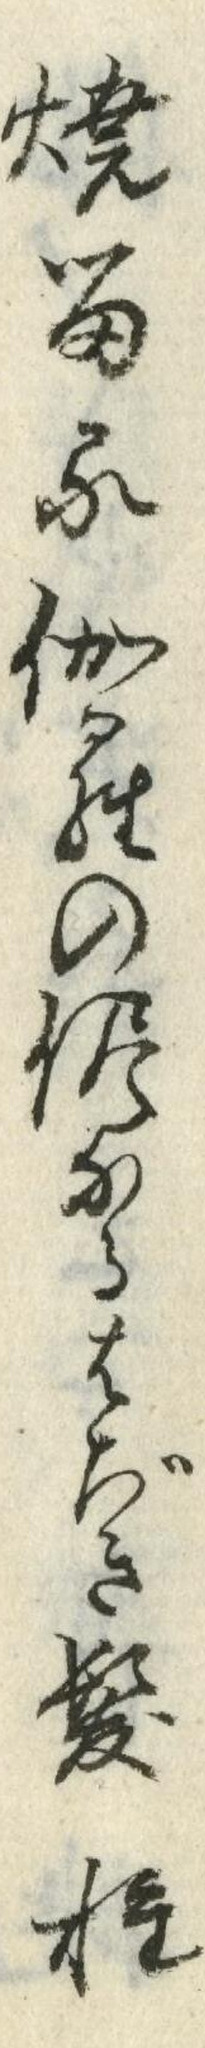焼留る伽羅の侭なるはぢき髪種
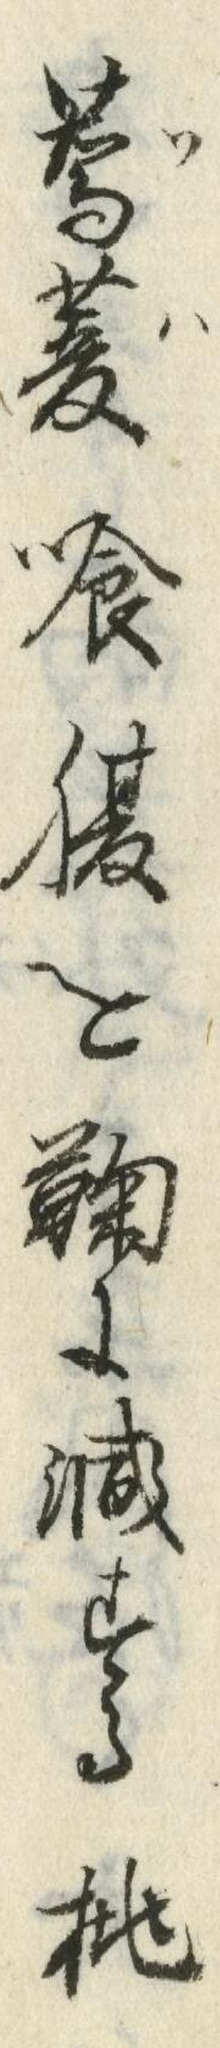蕎麦喰腹を鞠に減する桃
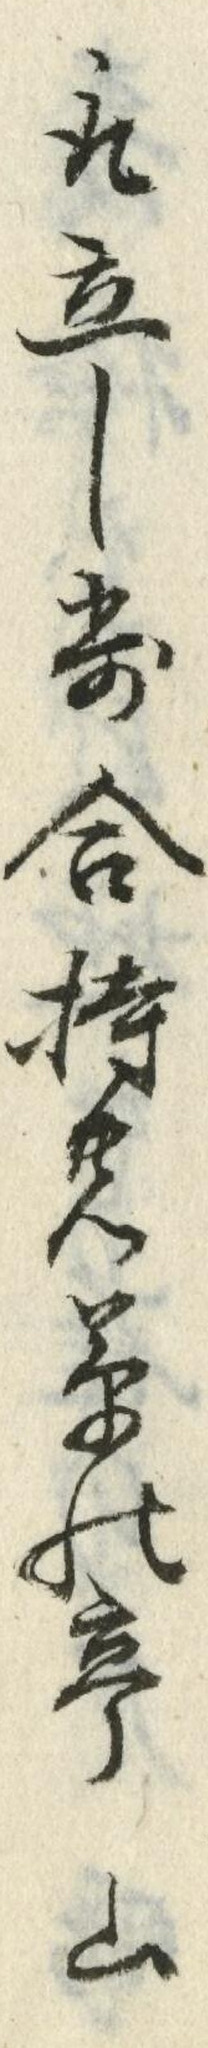取立し寄合持の草の亭山
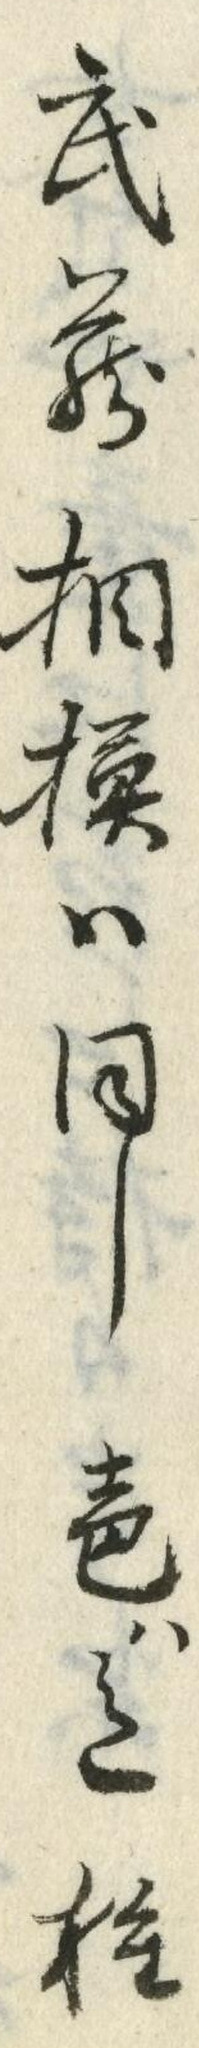武蔵相模は同し声ハ色種
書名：誹諧　能登釜
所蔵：Ishikawa Prefectural Library
